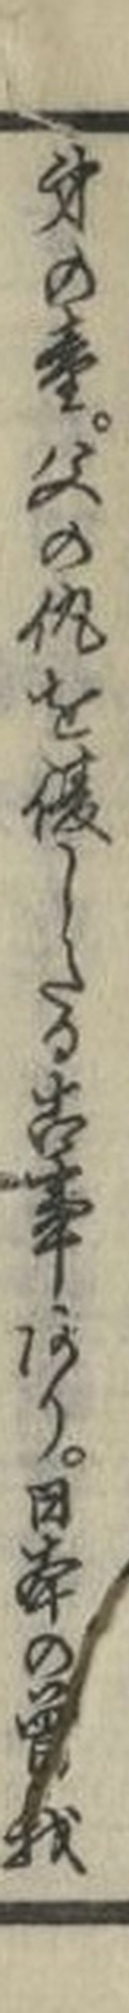弟の童。父の仇を復したる古事あり。日本の曽我

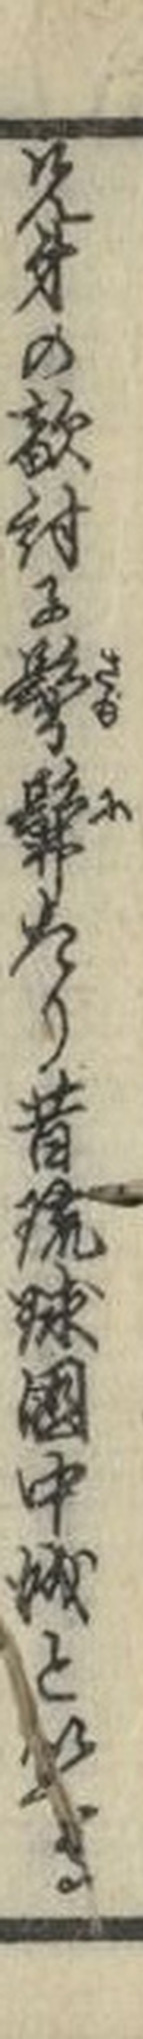兄弟の敵討に髣髴たり昔琉球国中城といへる
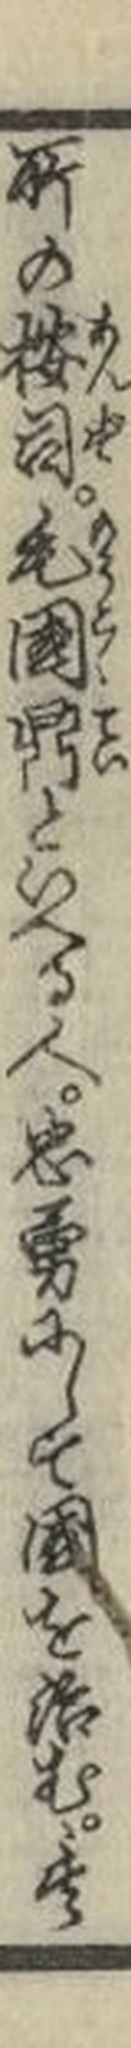所の按司。毛国鼎といへる人。忠勇にして国を治む。其
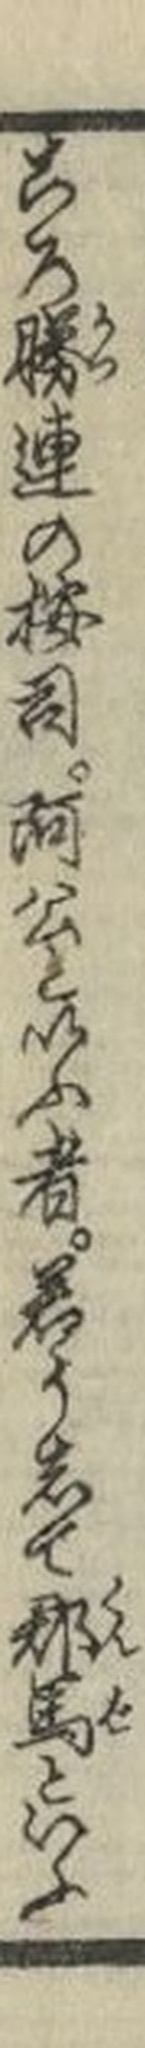ころ勝連の按司。阿公といふ者。若うして郡馬といふ
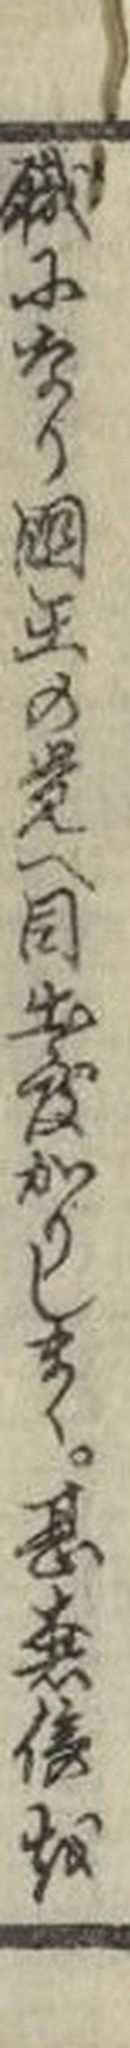職になり国王の覚へ目出度かりしまゝ。甚を
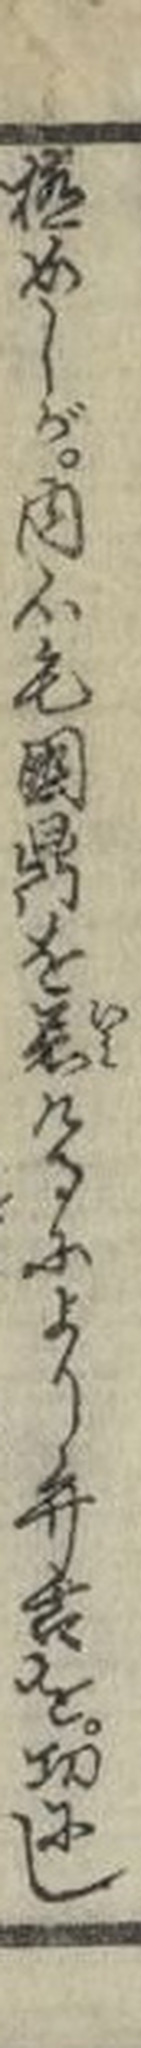極めしが。内心毛国鼎を忌けるにより弁舌を。功にし
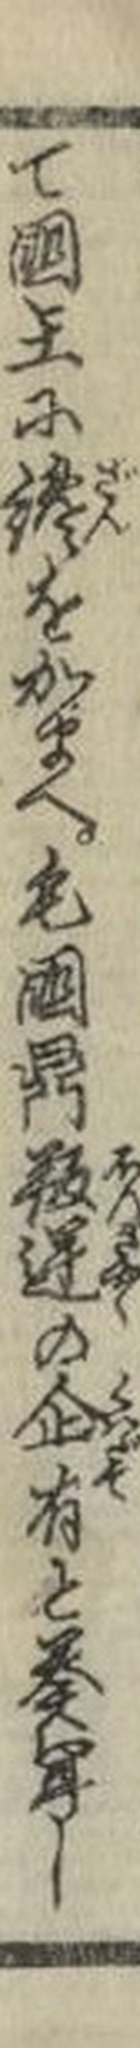て国王に讒をかまへ。毛国鼎叛逆の企有と奏聞し
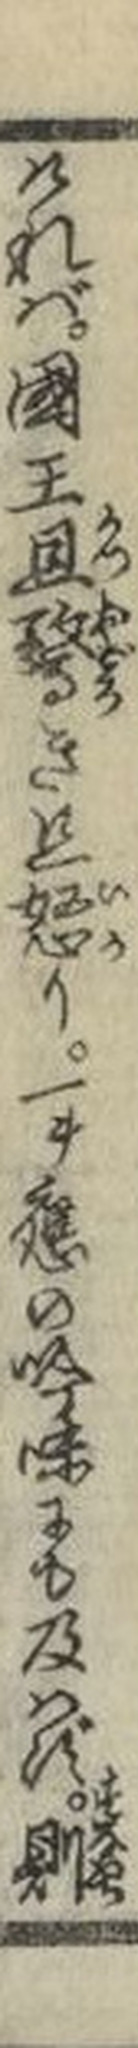ければ。国王且驚き且怒り。一チ応の吟味にも及はず。則
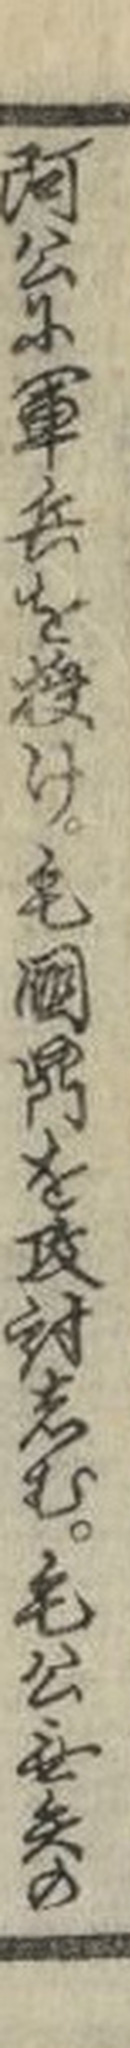阿公に軍兵を授け。毛国鼎を攻討しむ。毛公無矢の
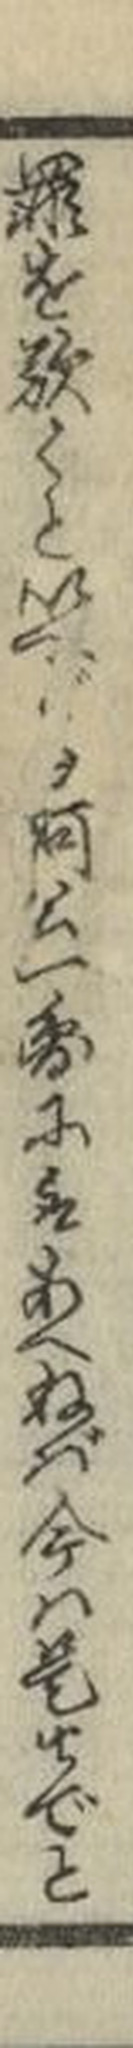罪を歎くといへども阿公一に取あへねば今は是までと
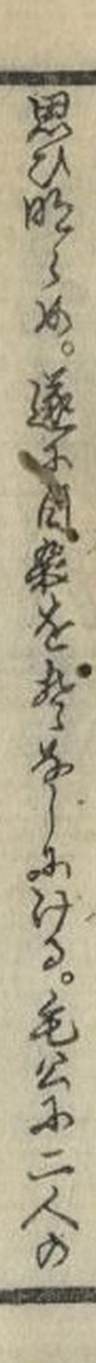思ひ明らめ。遂に自殺をそなしにける。毛公に二人の
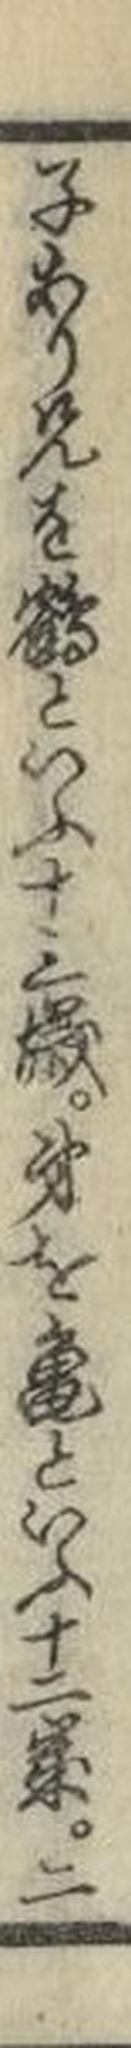子あり兄を鶴といふ十三歳。弟を亀といふ十二歳。二
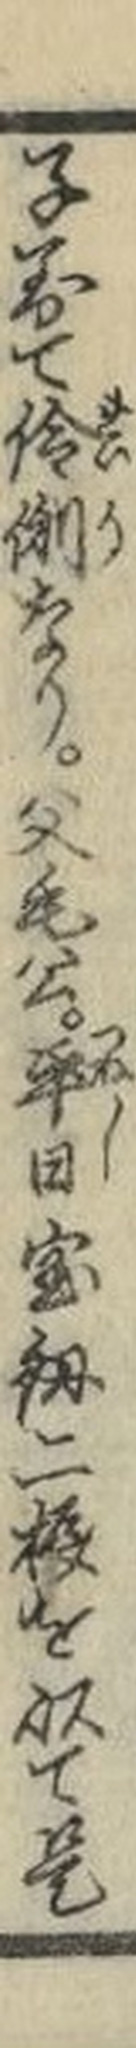子別て伶俐なり。父毛公。平日宝剣二振を以て是
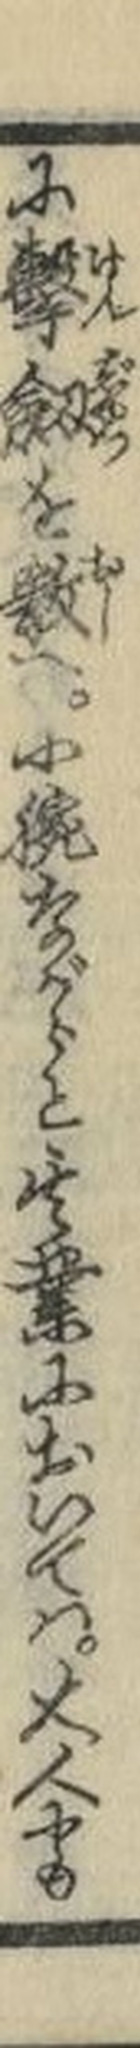に撃剣を教へ。小腕ながらと其業においては。大人中も
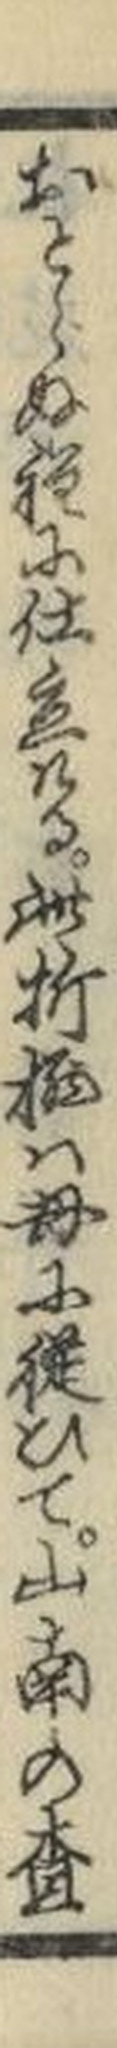おとらぬ様に仕立ける。此折は母に従ひて。山南の査
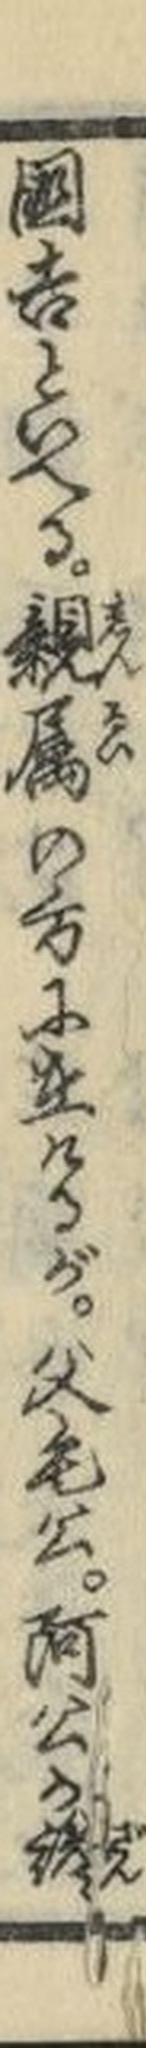国吉といへる。親属の方に出けるが。父毛公。阿公か讒
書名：琉球解語
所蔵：University of the Ryukyus Library
